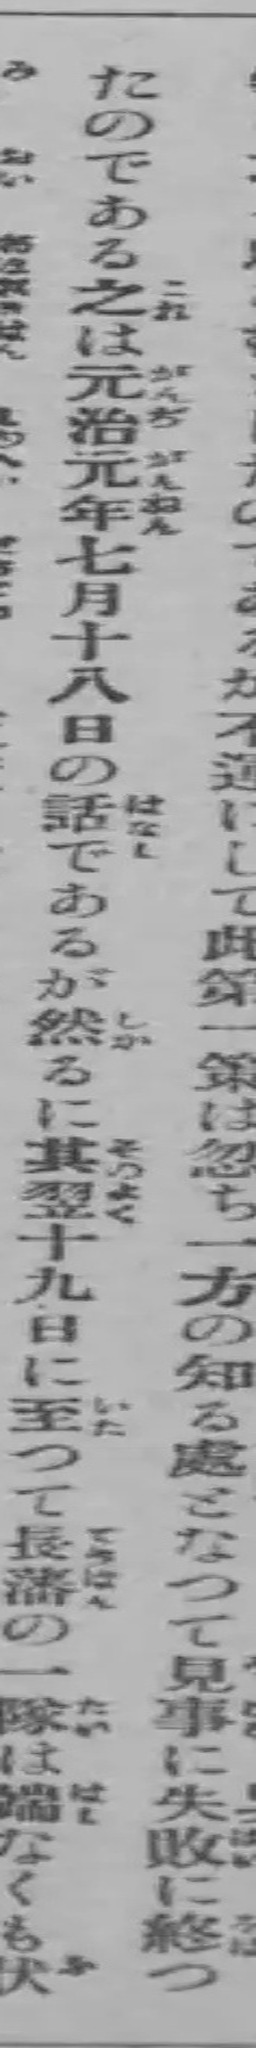たのである之は元治元年七月十八日の話であるが然るに其翌十九日に至つて長藩の一隊は端なくも伏
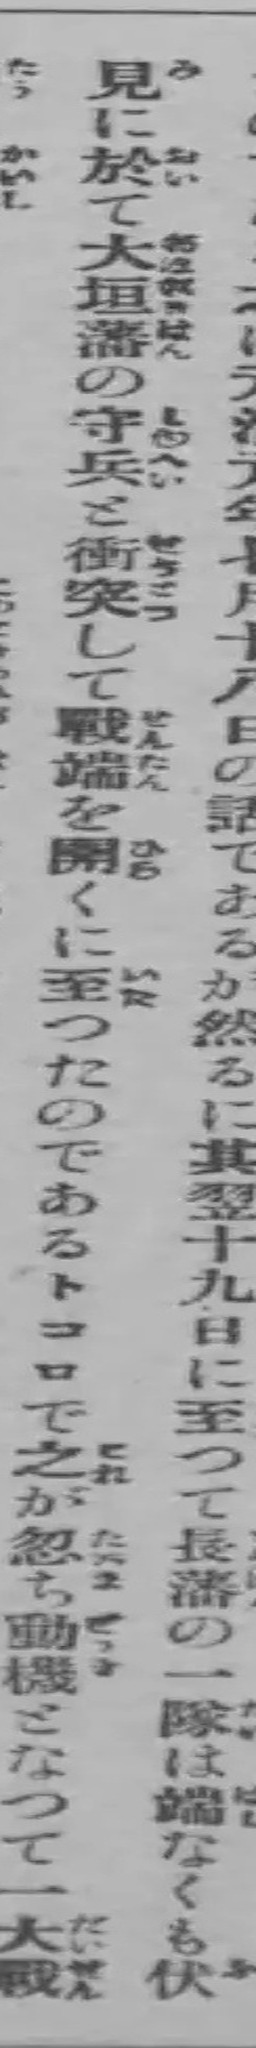見に於て大垣藩の守兵と衝突して戦端を開くに至つたのであるトコロで之が忽ち動機となつて一大戦
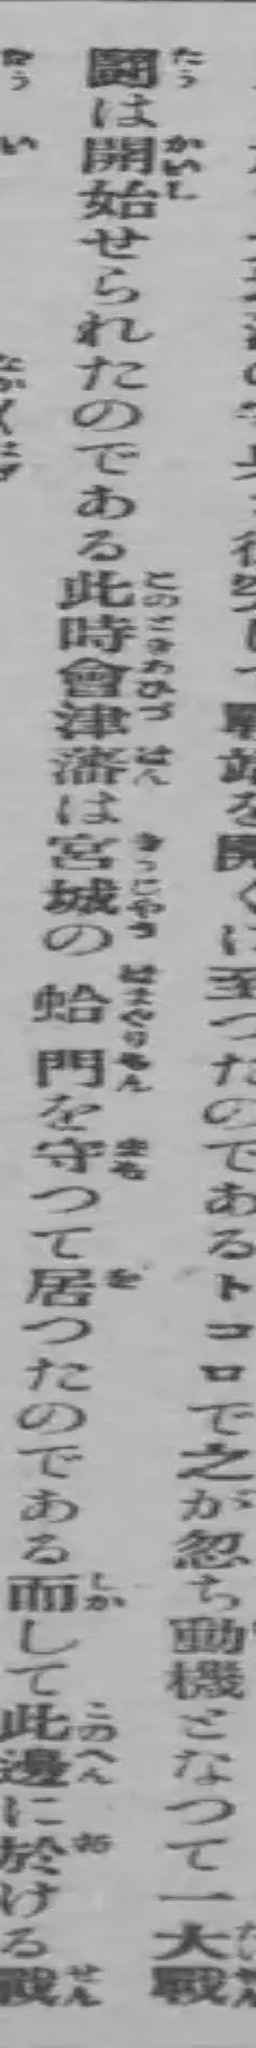蛤門の戦闘闘は開始せられたのである此時会津藩は宮城の蛤門を守つて居つたのである而して此辺に於ける戦
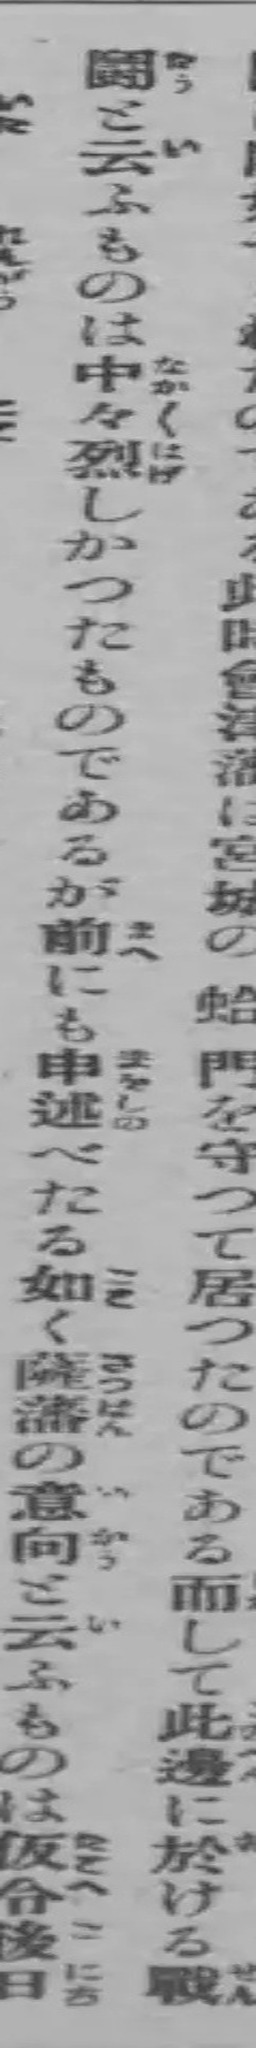闘と云ふものは中々烈しかつたものであるが前にも申述べたる如く薩藩の意向と云ふものは仮令後日
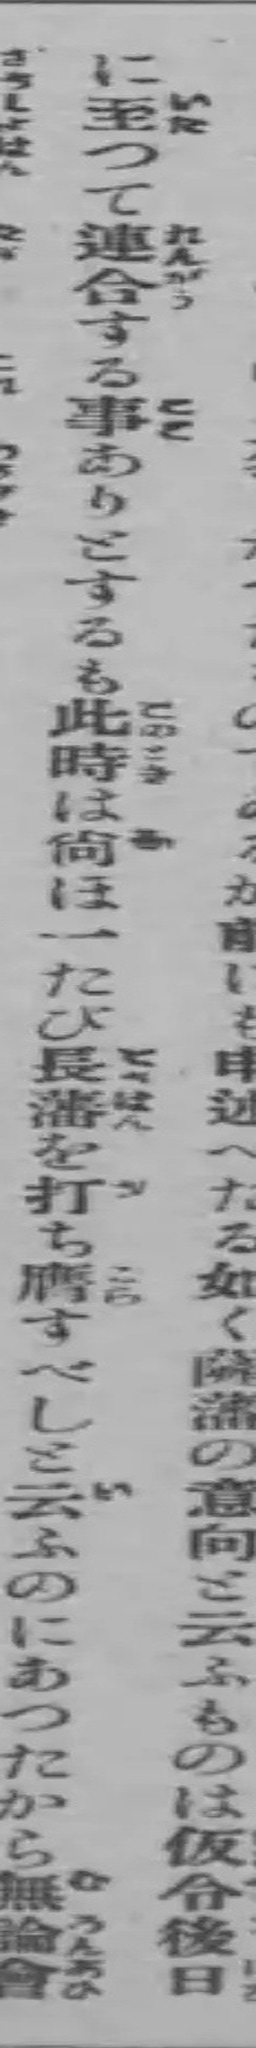に至つて連合する事ありとするも此時は尚ほ一たび長藩を打ち膺すべしと云ふのにあつたから無論会
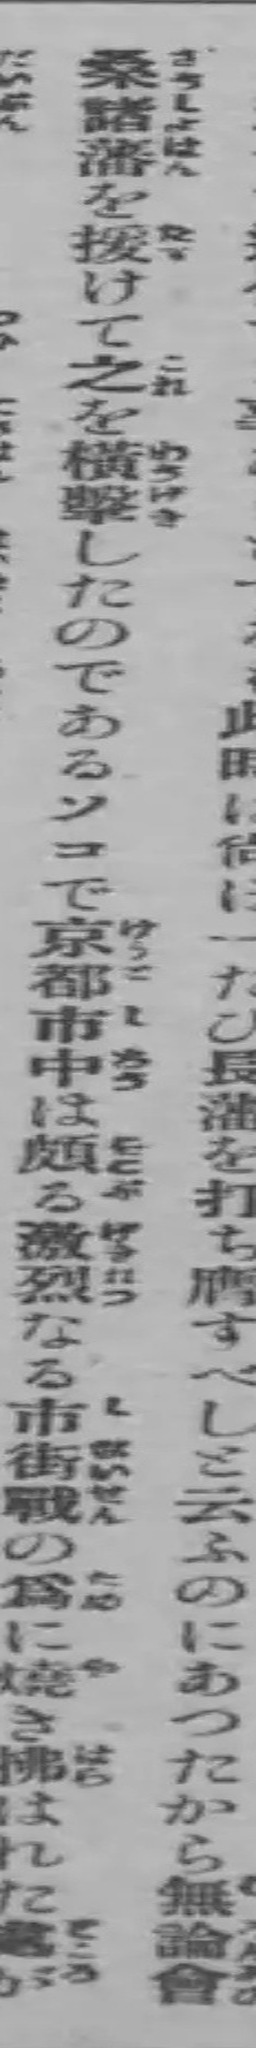桑緒藩を援けて之を横撃したのであるソコで京都市中は頗る激烈なる市街戦の為に焼き払はれた処が
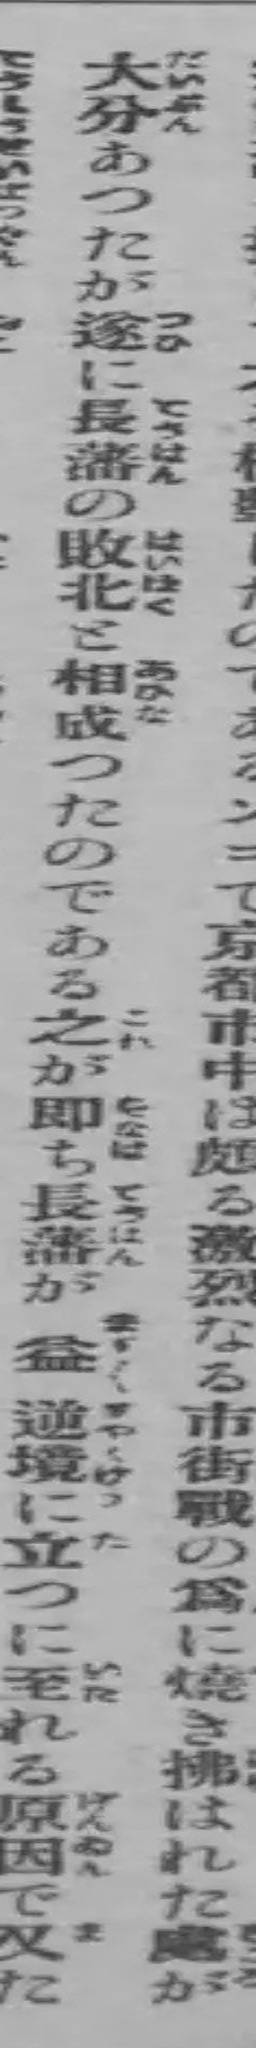大分あつたが遂に長藩の敗北と相成つたのである之即ち長藩が益逆境に立つに至れる原因で又た
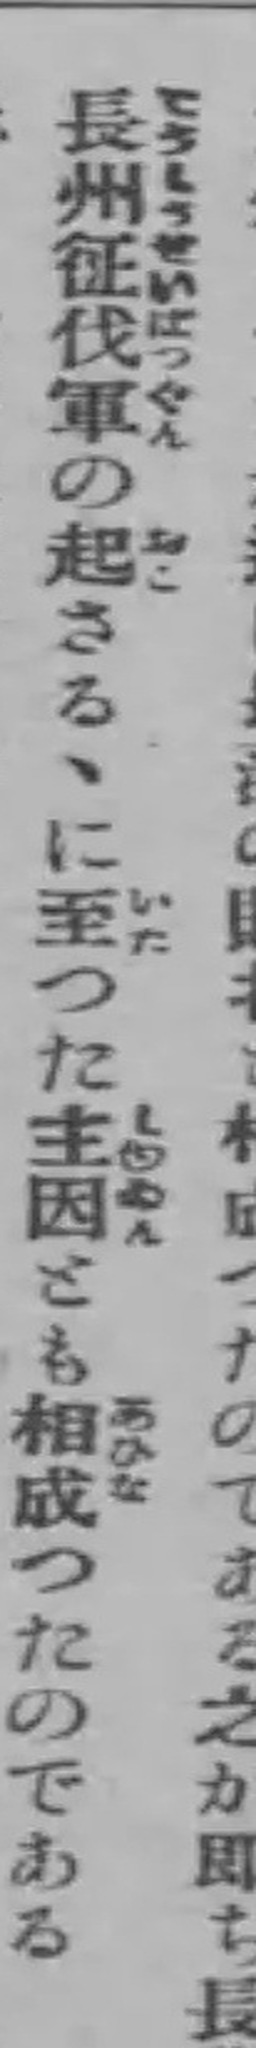長州征伐軍の起さるゝに至つた主因とも相成つたのである
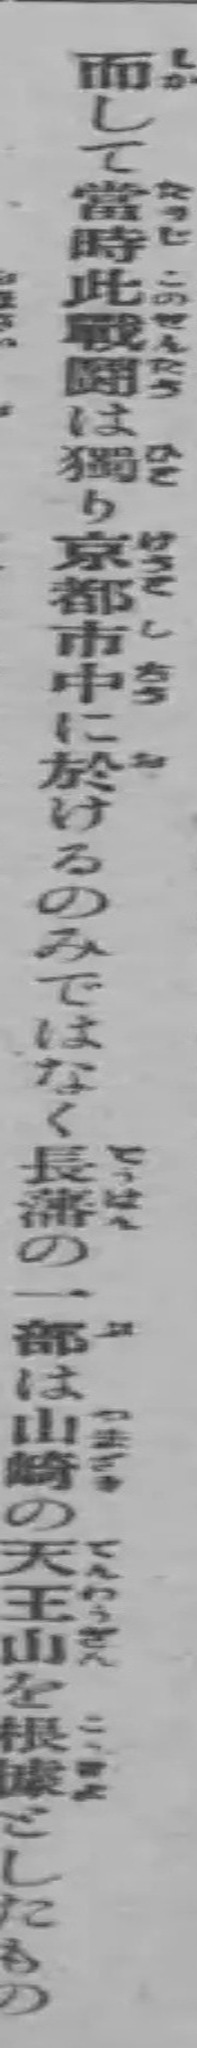而して当時此戦闘は独り京都市中に於けるのみではなく長藩の一部は山崎の天王山を根拠としたもの
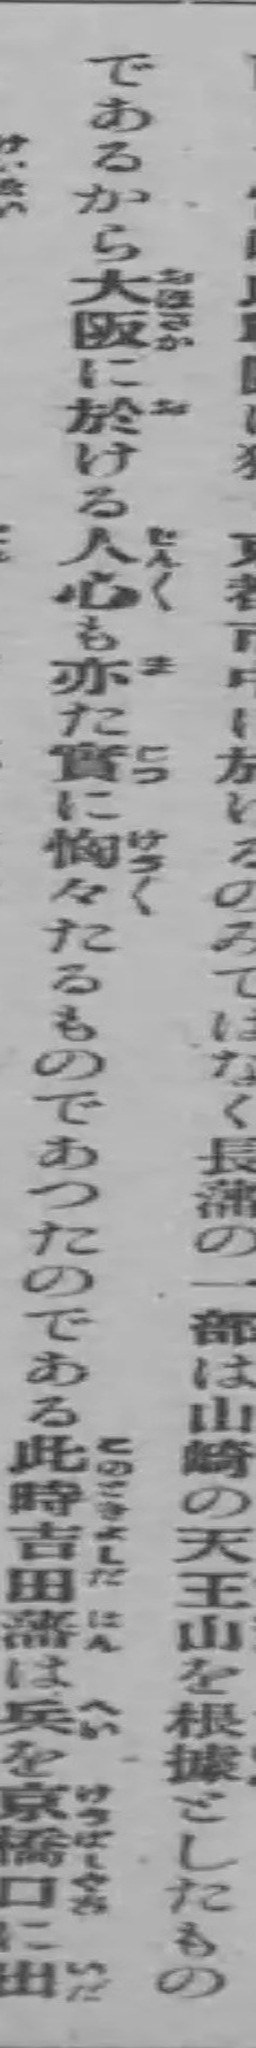であるから大阪に於ける人心も亦た実に恟々たるものであつたのである此時吉田藩は兵を京橋口に出
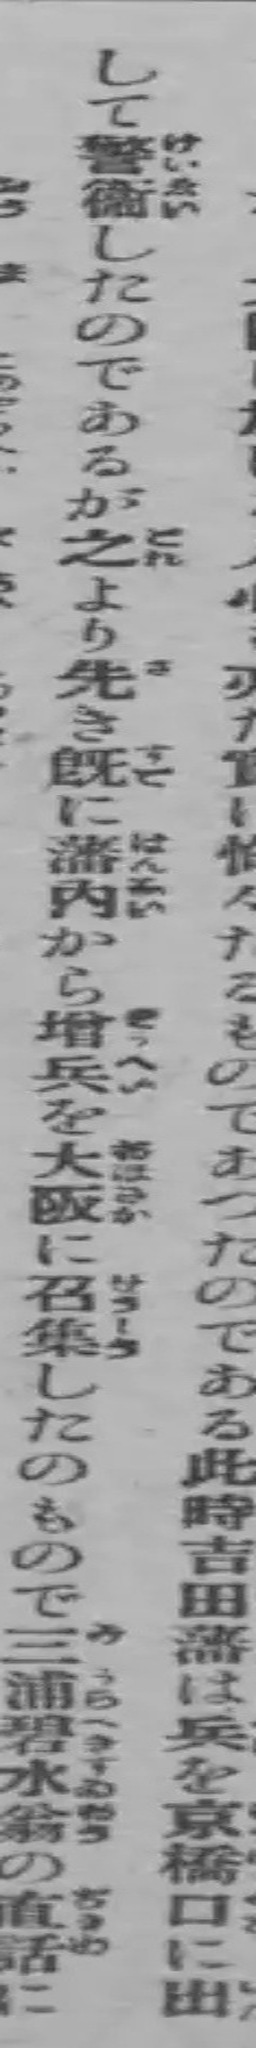して警衛したのであるが之より先き既に藩内から増兵を大阪に召集したもので三浦碧水翁の直話に
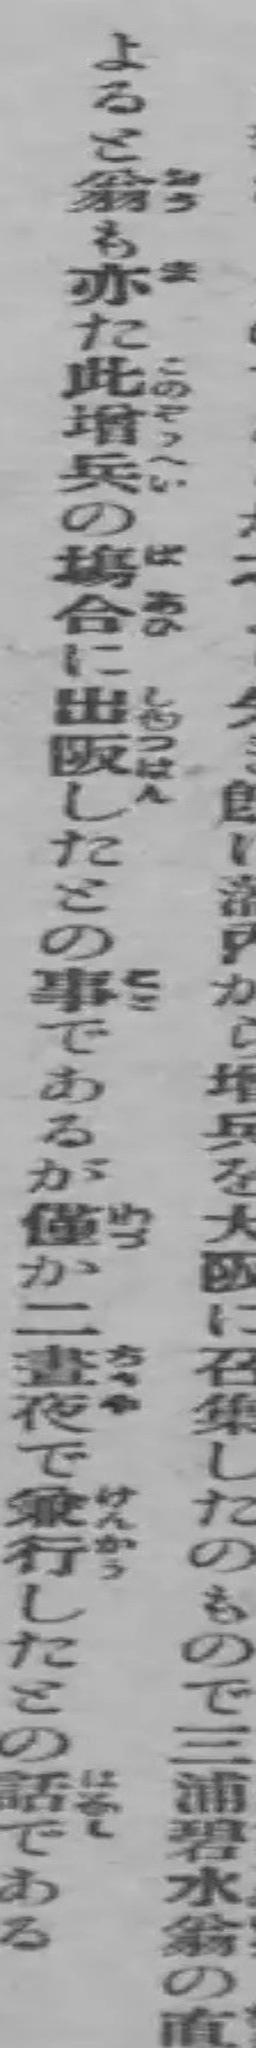よると翁も亦た此増兵の場合に出阪したとの事であるが僅か二昼夜で兼行したとの話である
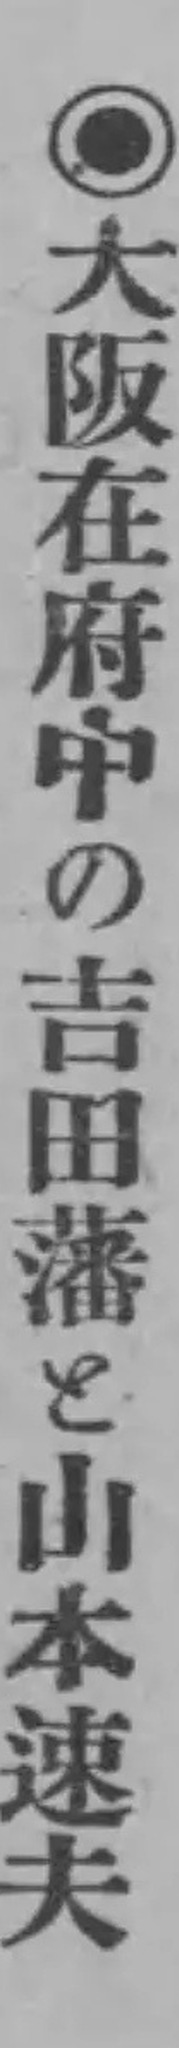⦿大阪在府中の吉田藩と山本速夫
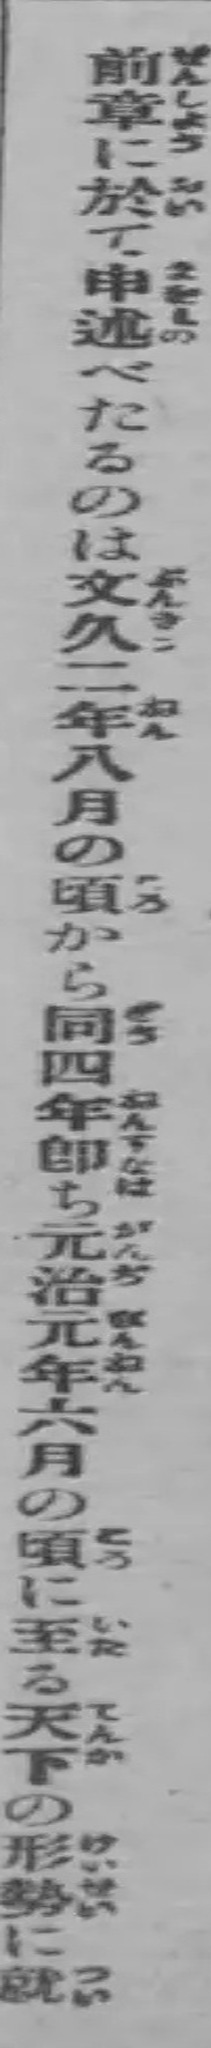前章に於て申述べたるのは文久二年八月の頃から同四年即ち元治元年六月の頃に至る天下の形勢に就
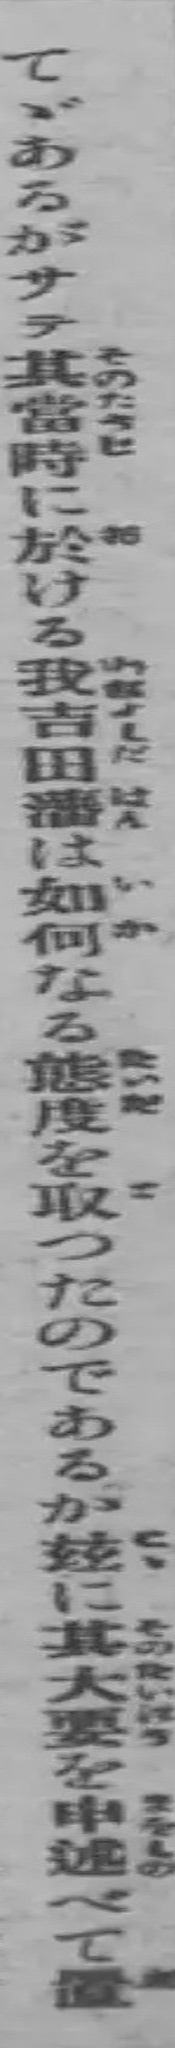てゞあるがサテ其当時に於ける我吉田藩は如何なる態度を取つたのであるか茲に其大要を申述べて置
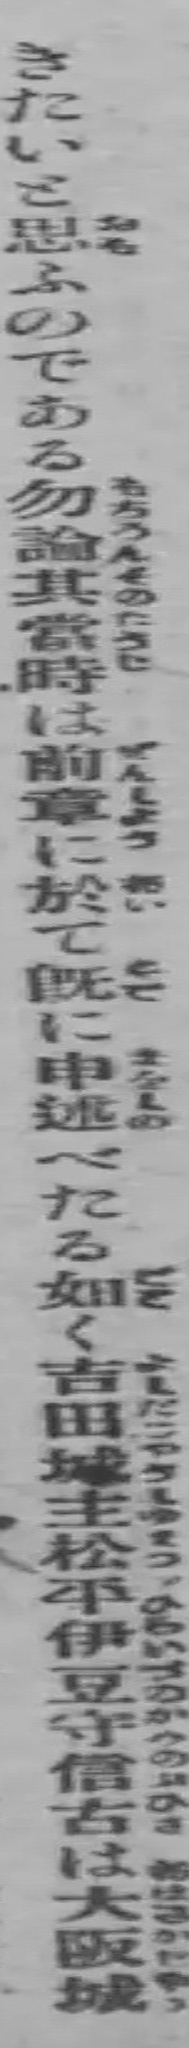きたいと思ふのである勿論其当時は前章に於て既に申述べたる如く吉田城主松平伊豆守信古は大阪城
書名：豊橋市史談
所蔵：国立国会図書館 National Diet Library, JAPAN
